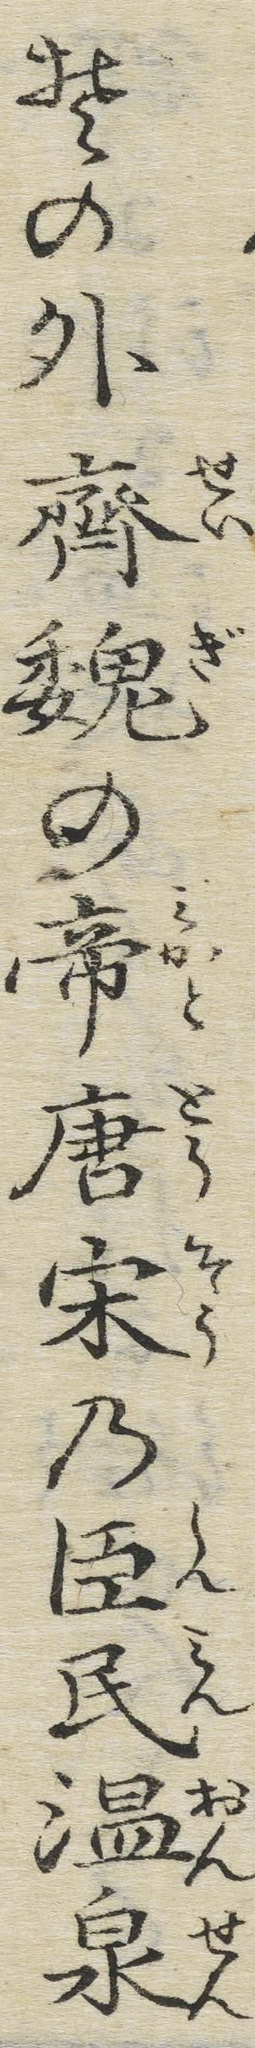その外齊魏の帝唐宋の臣民温泉
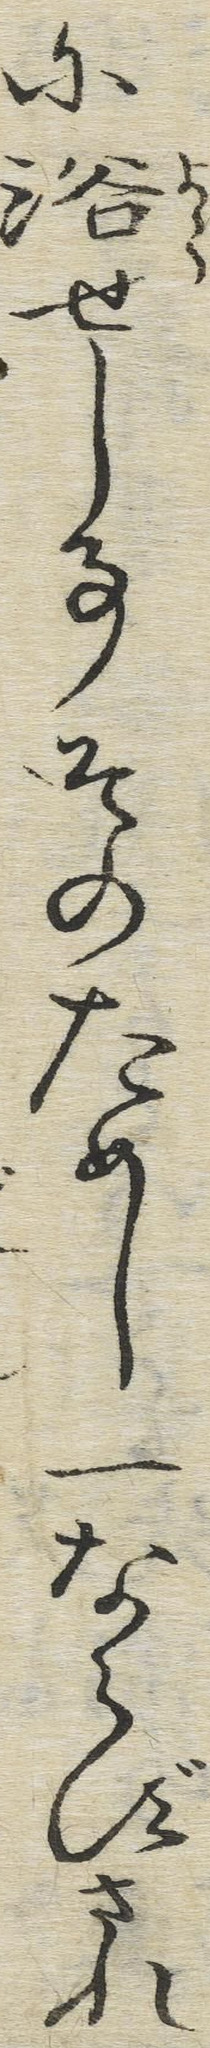に浴せし事そのためし一ならずされ
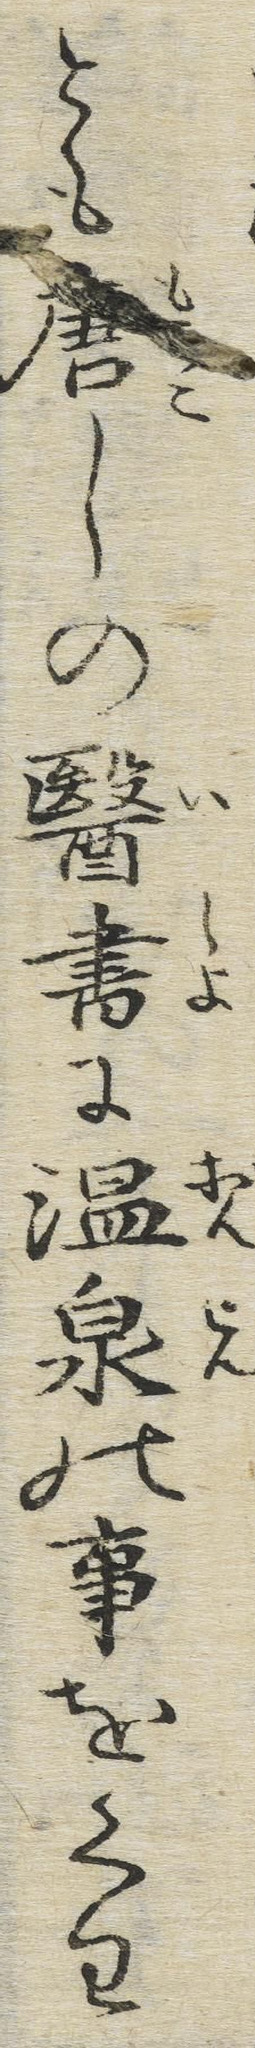とも唐しの医書に温泉の事をくわ
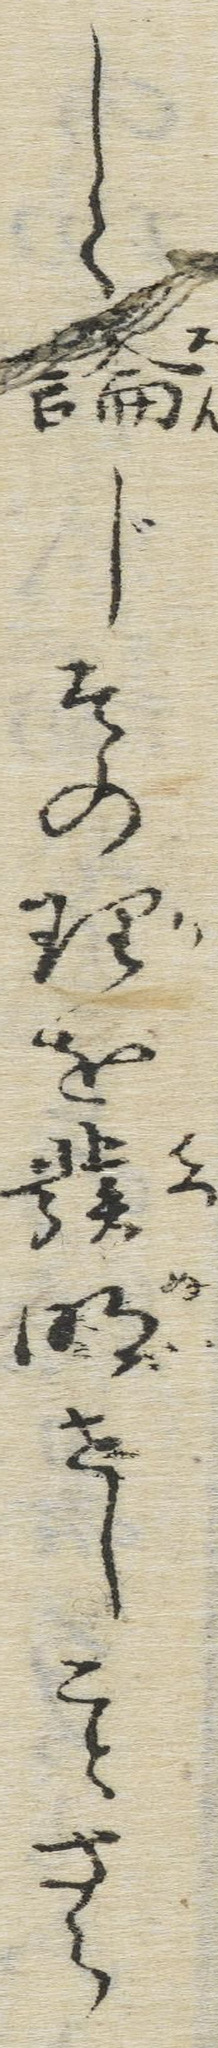しく論じその理を発明せしことさら
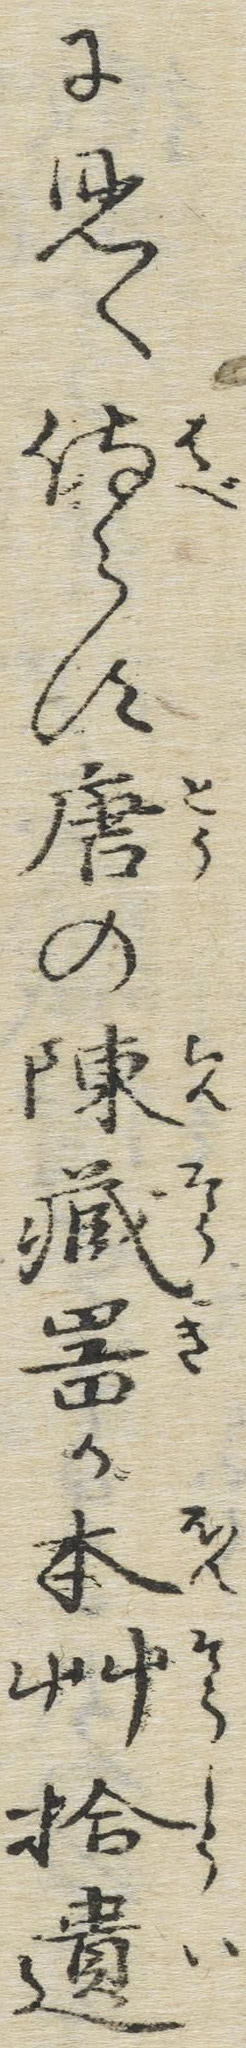に見へ侍らす唐の陳藏器か本艸拾遺
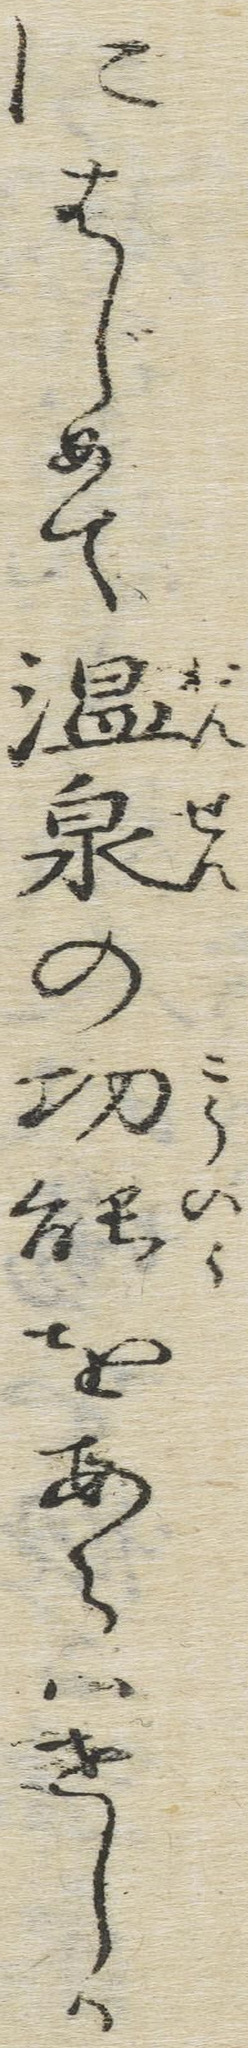にはじめて温泉の功能をあらはせしか
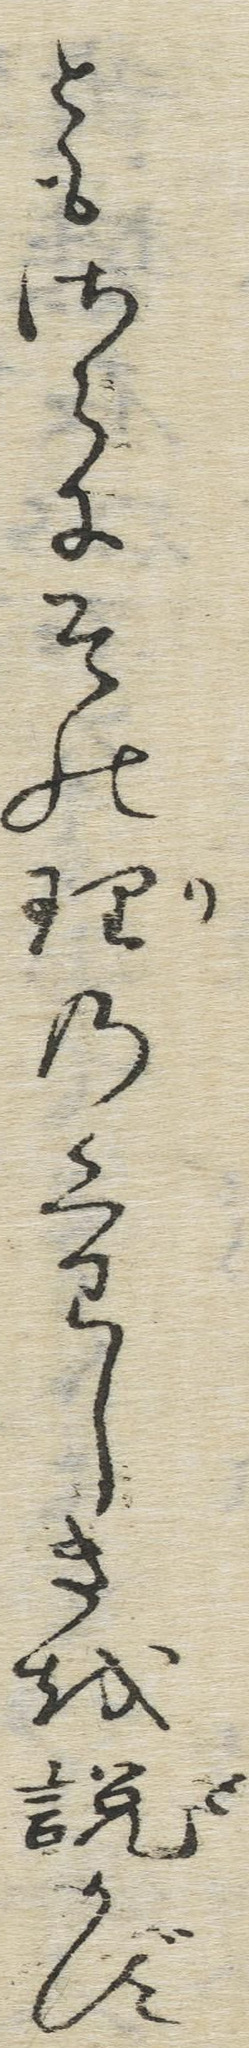ともさらにその理のくわしきを説かず
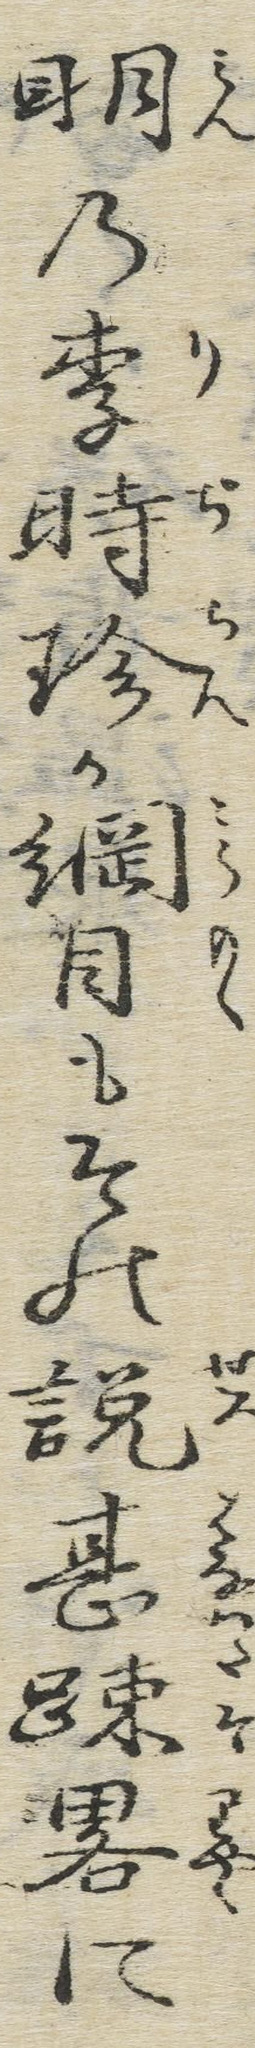明の李時珍か綱目もその説甚疎略に
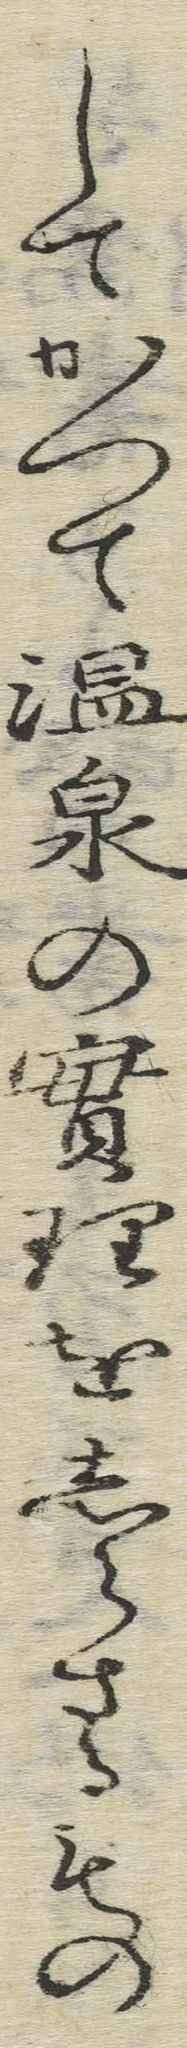してかつて温泉の実理をしらさるもの
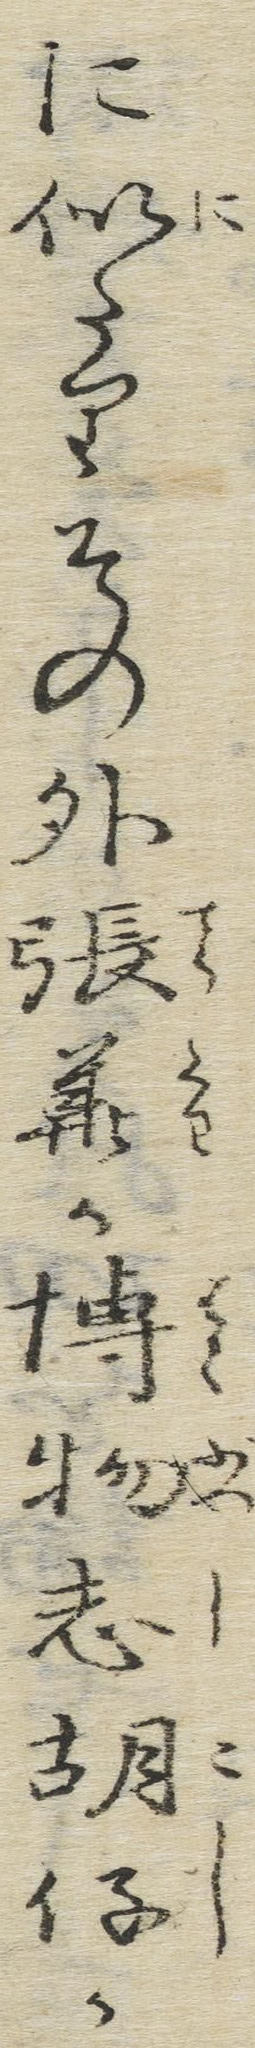に似たりその外張華か博物志胡仔か
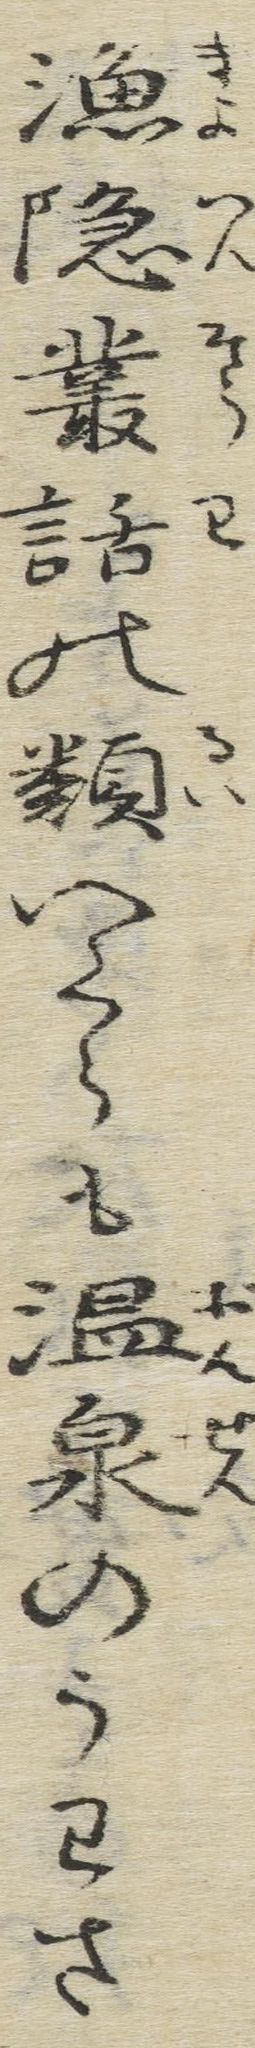漁隠叢話の類いくらも温泉のうわさ

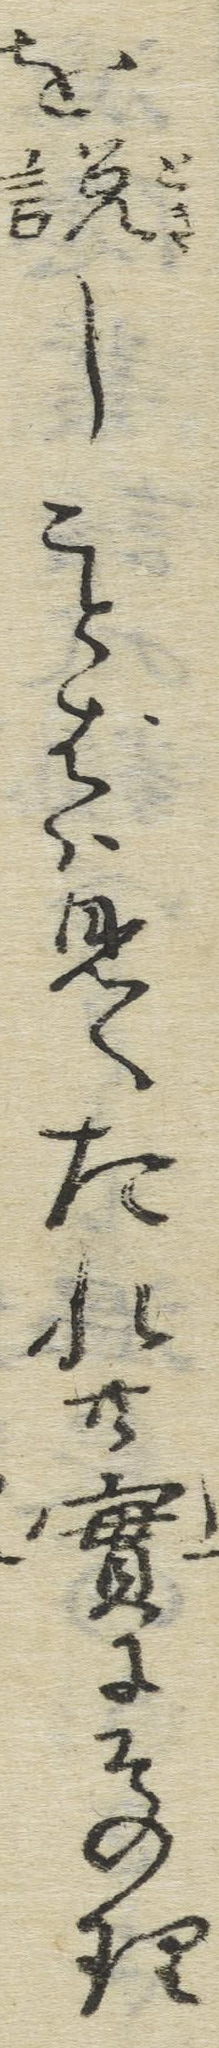を説しことはは見へたれ共実にその理
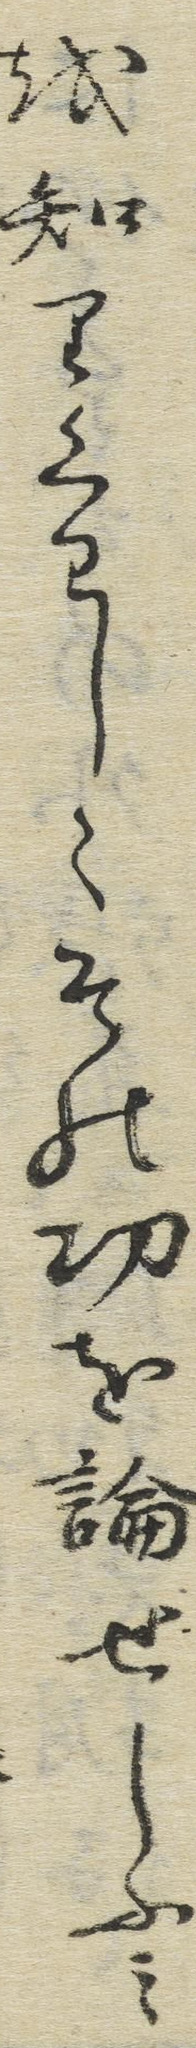を知りくわしくその功を論せしふみ
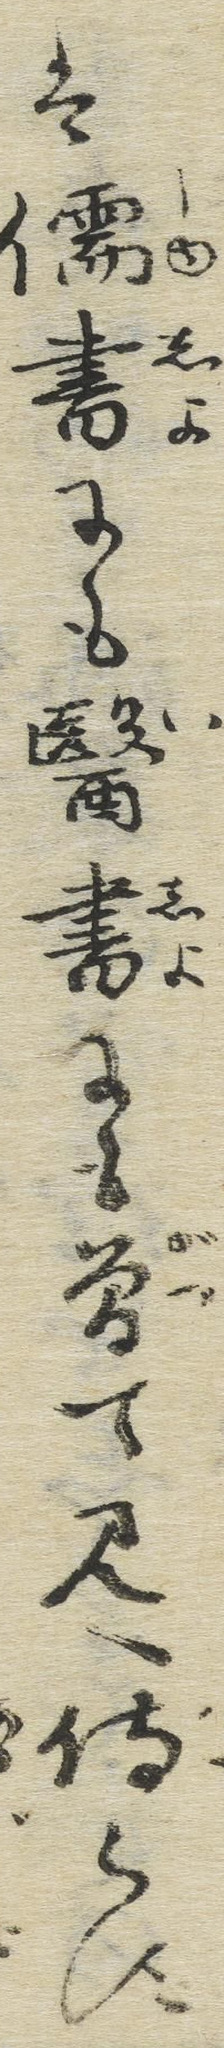は儒書にも医書にも曽て見へ侍らす
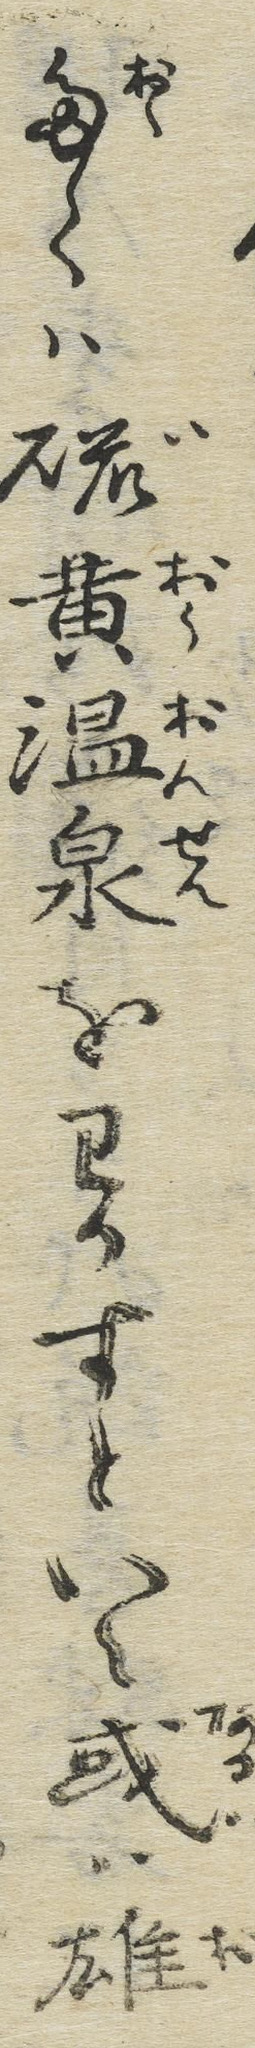多くは硫黄温泉をわかすといゝ或は雄
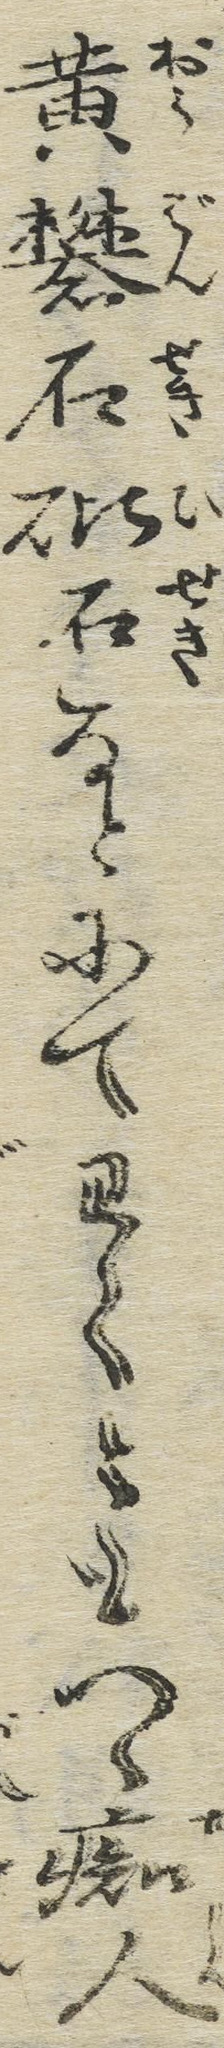黄礬石砒石なとにてわくともいゝ痴人
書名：温泉考
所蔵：東京大学地震研究所図書室 Earthquake Research Institute Library, The University of Tokyo, JAPAN
